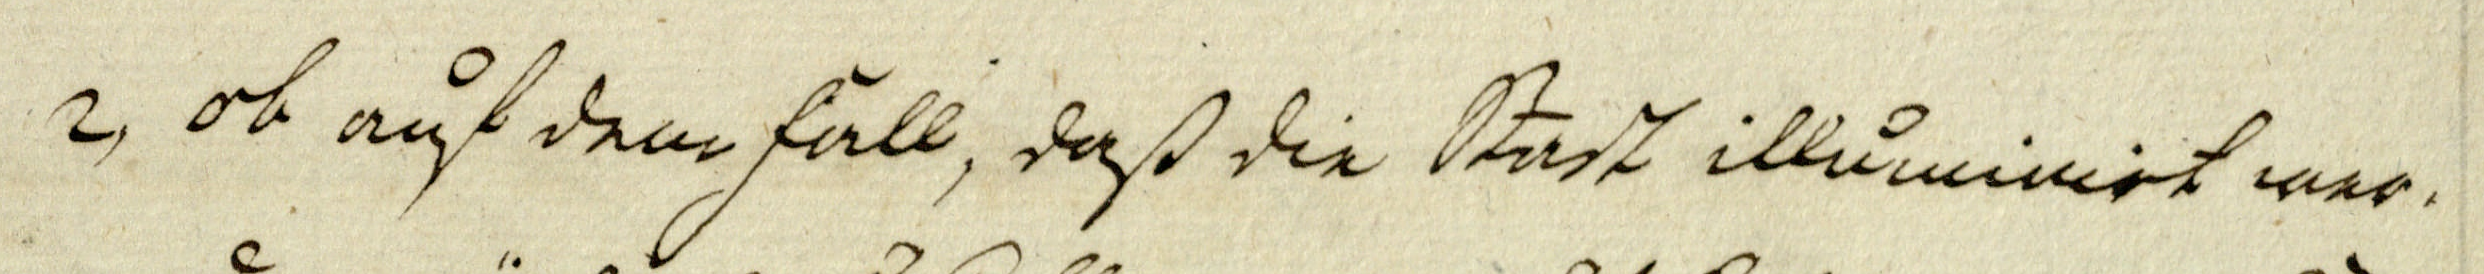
2, ob auf dem Fall, daß die Stadt ilumimirt wer
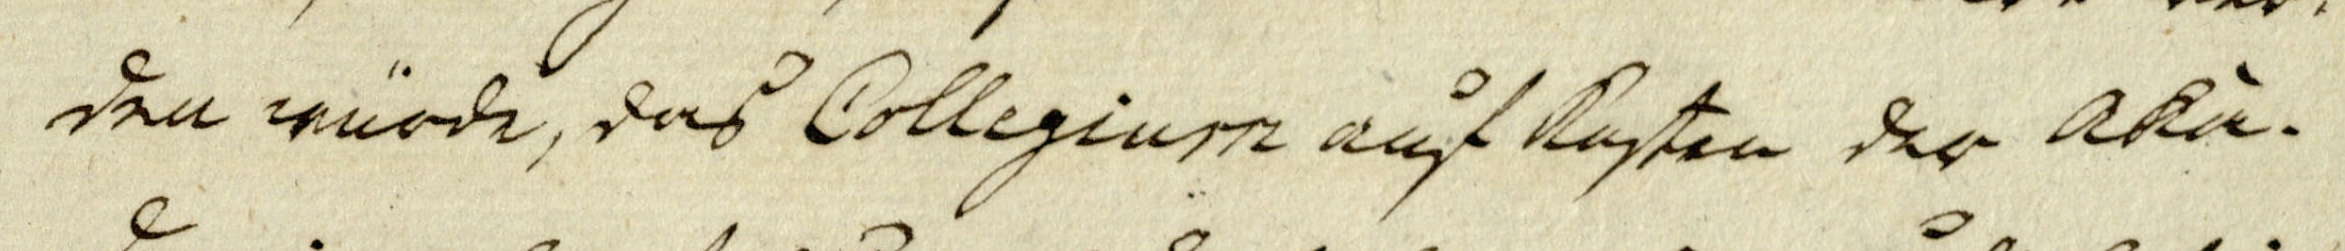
den würde, das Collegium auf Kosten der Aka¬
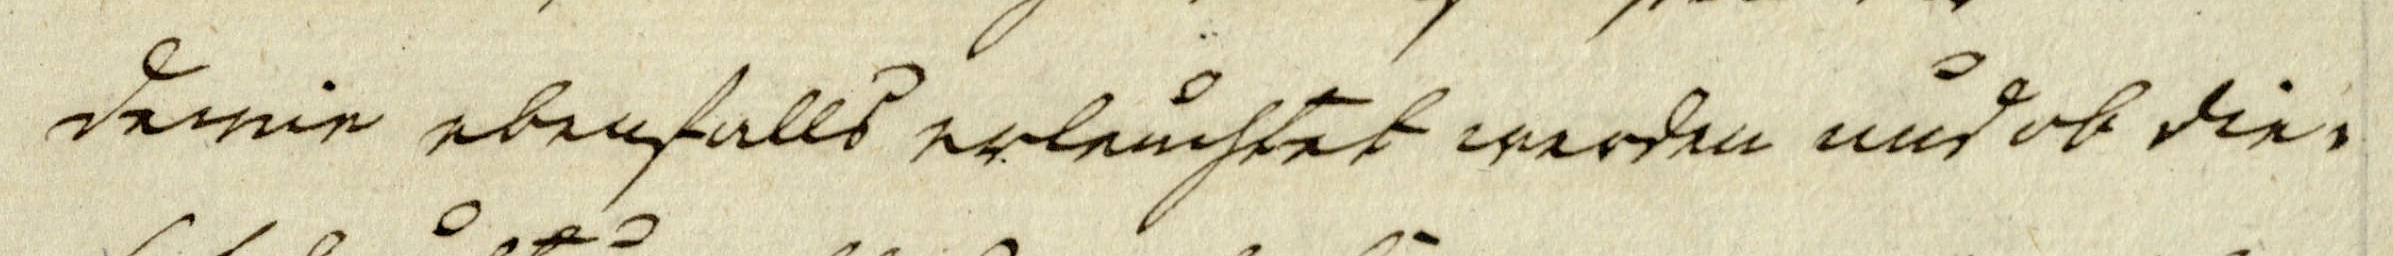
demie ebenfalls erleuchtet werden und ob die¬
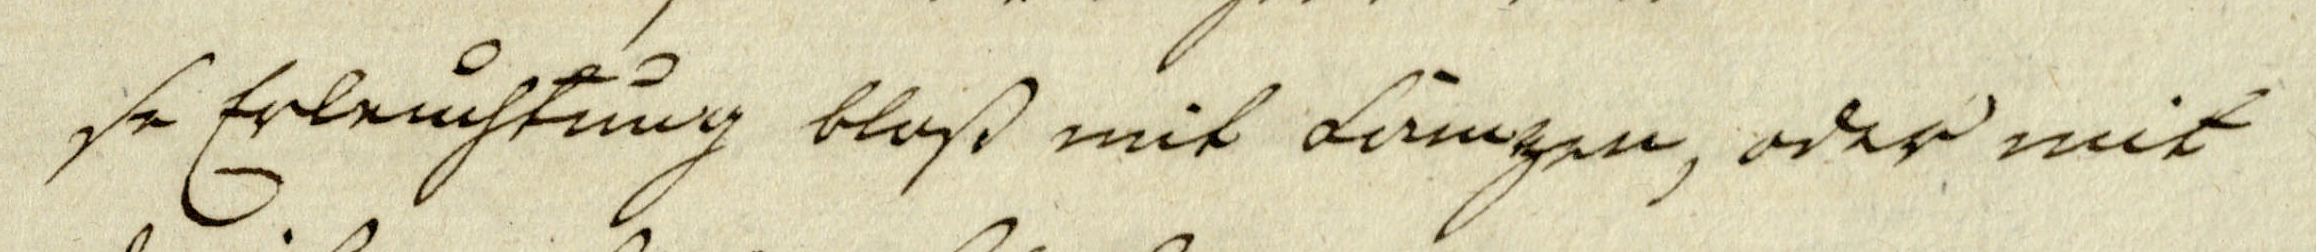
se Erleuchtung bloß mit Lampen, oder mit
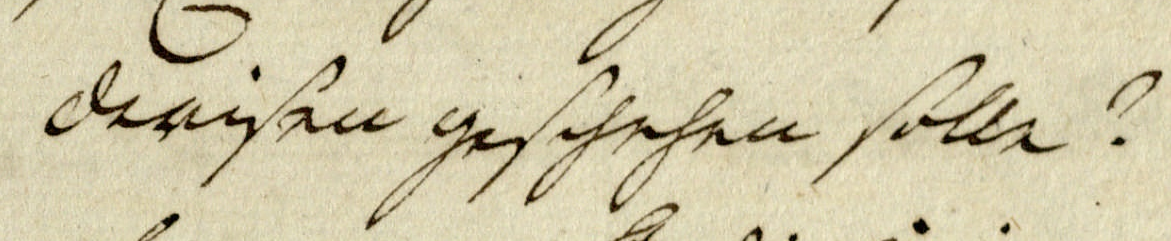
Devisen geschehen solle?
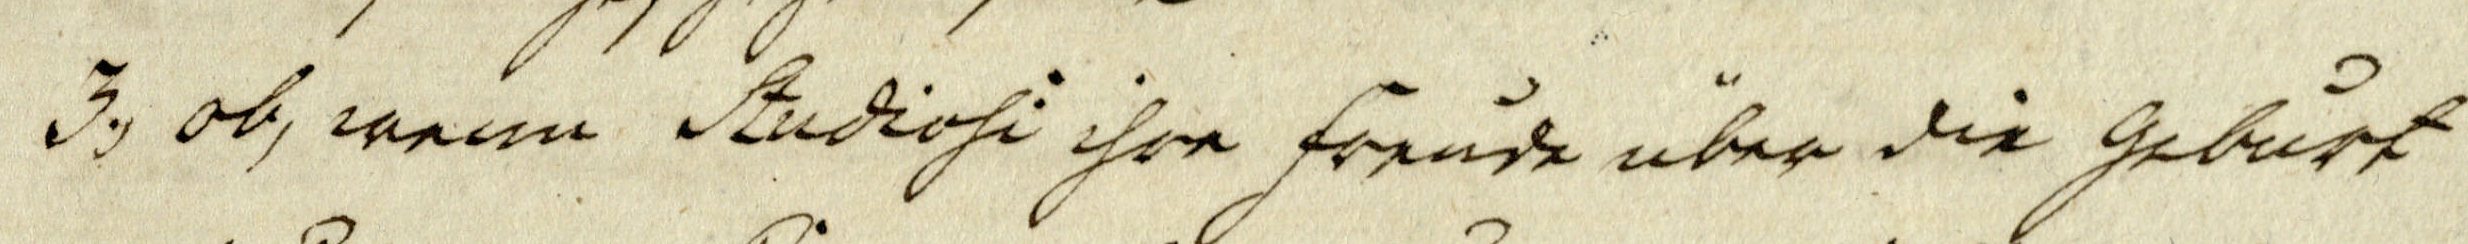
3., ob, wenn Studiosi ihre Freude über die Geburt
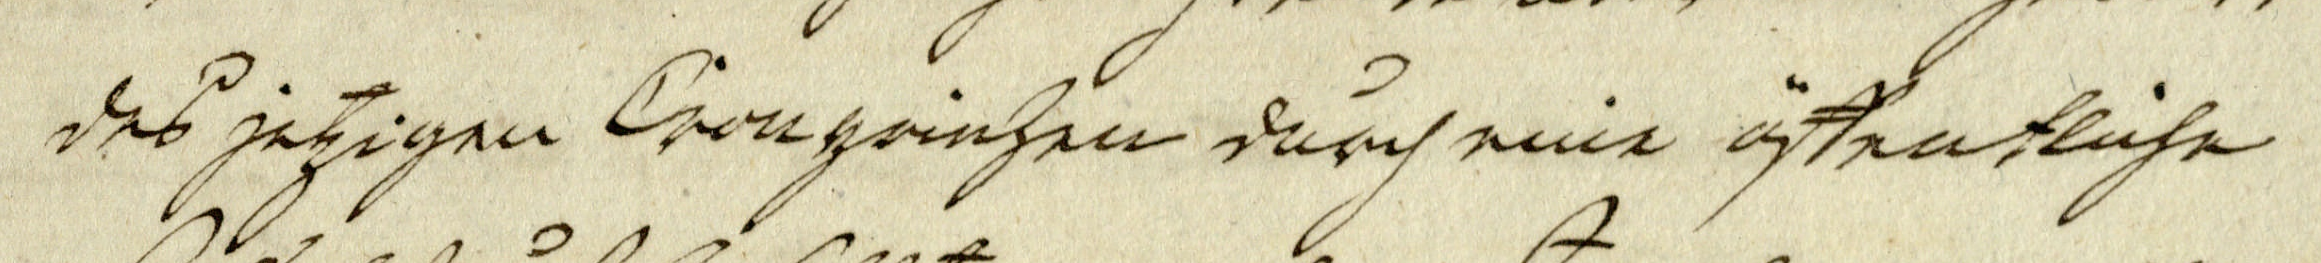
des jetzigen Cronprinzen durch eine öffentliche
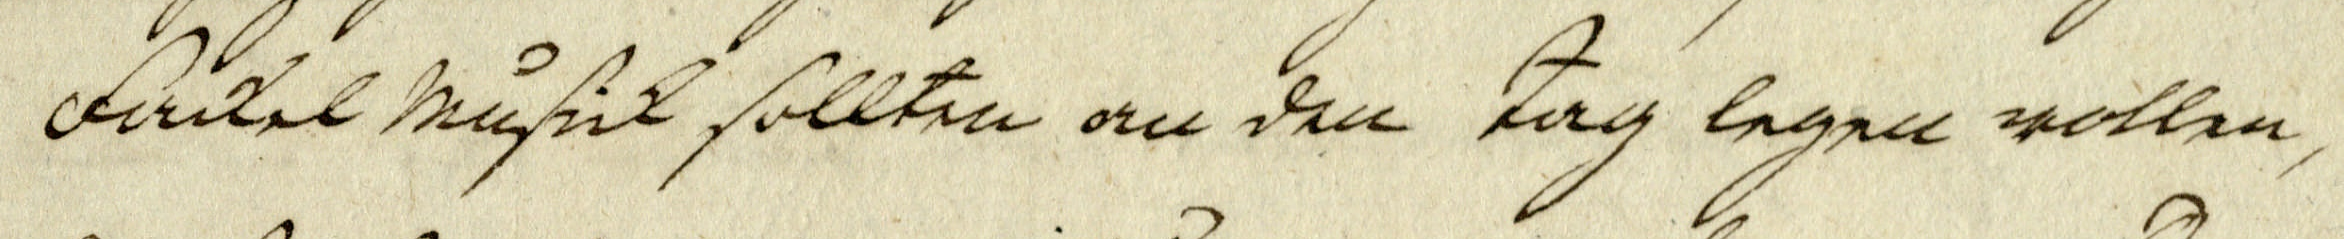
Fackel Musick sollten an den Tag legen wollen,
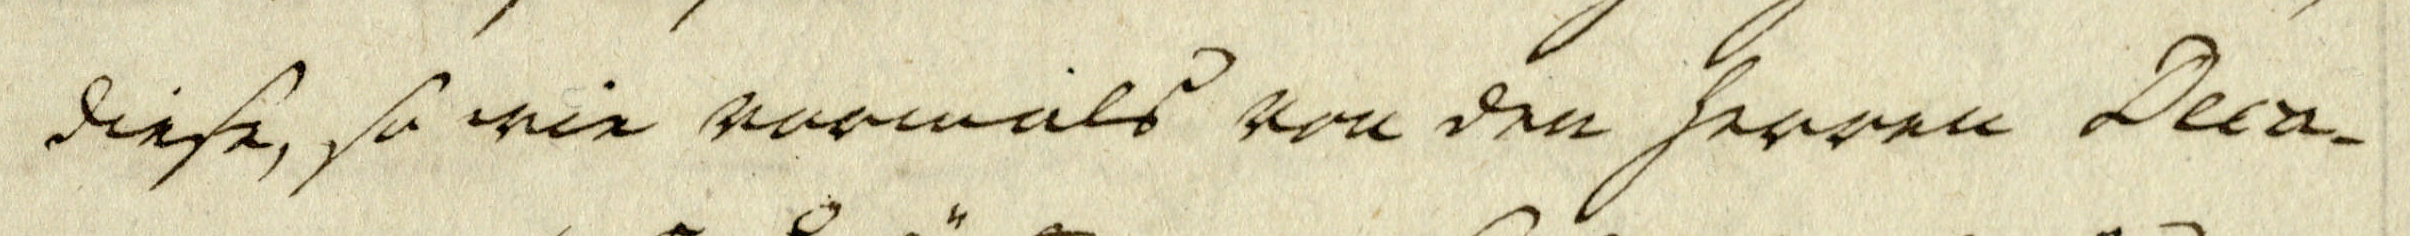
diese, so wie vormals von den Herren Deca¬
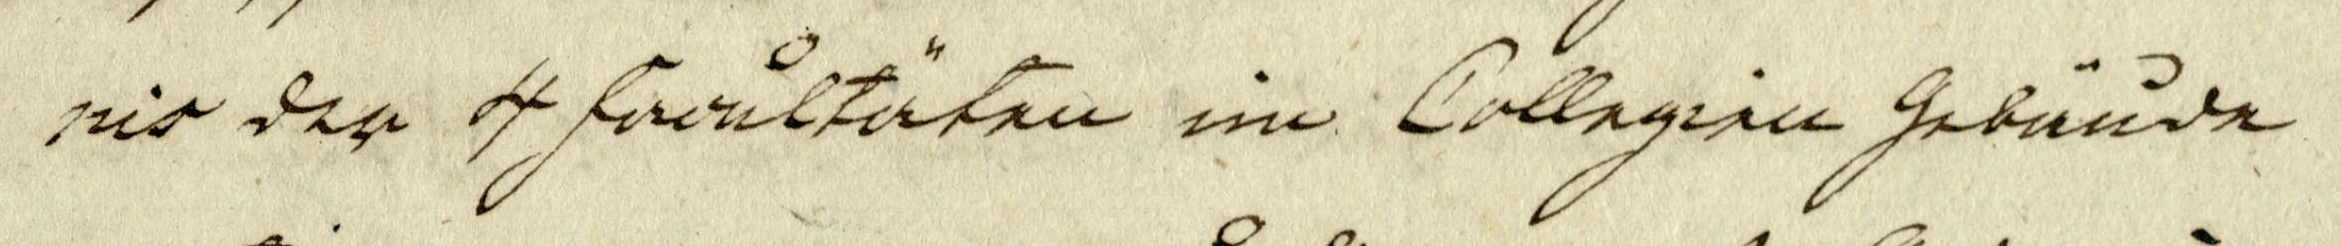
nis der 4 Facultäten im Collegien Gebäude
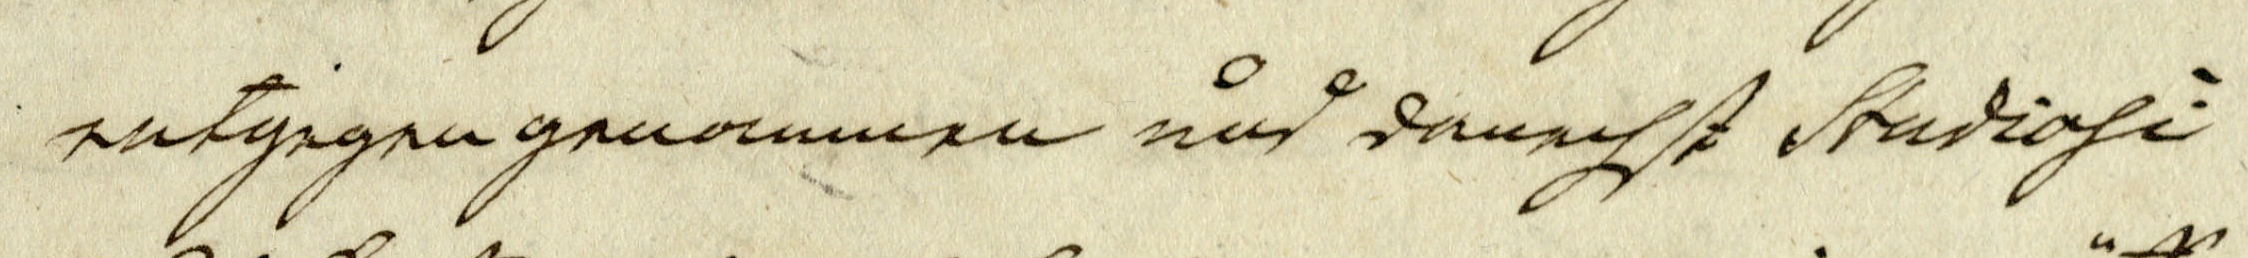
entgegen genommen und danechst Studiosi
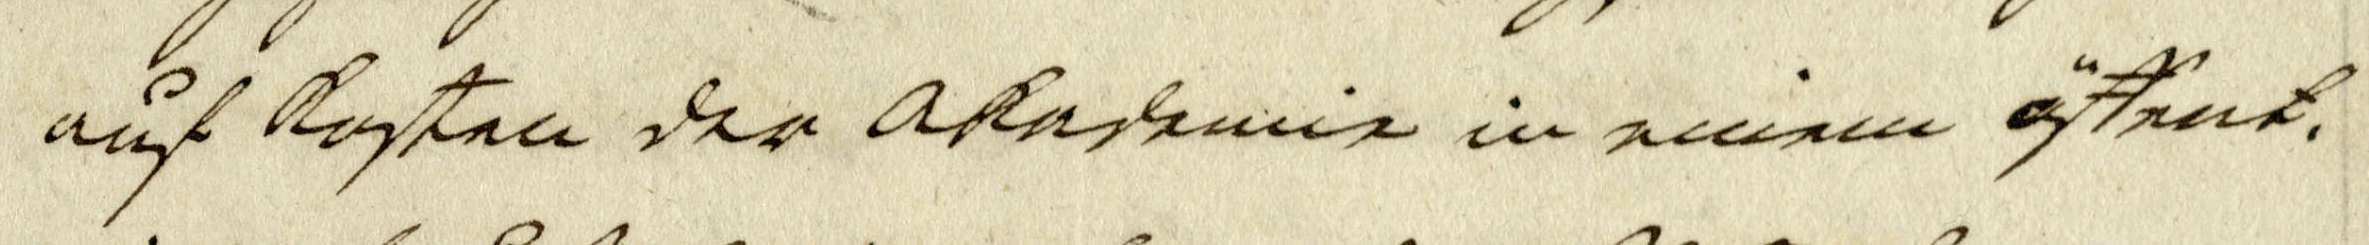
auf Kosten der Akademie in einem öffent¬
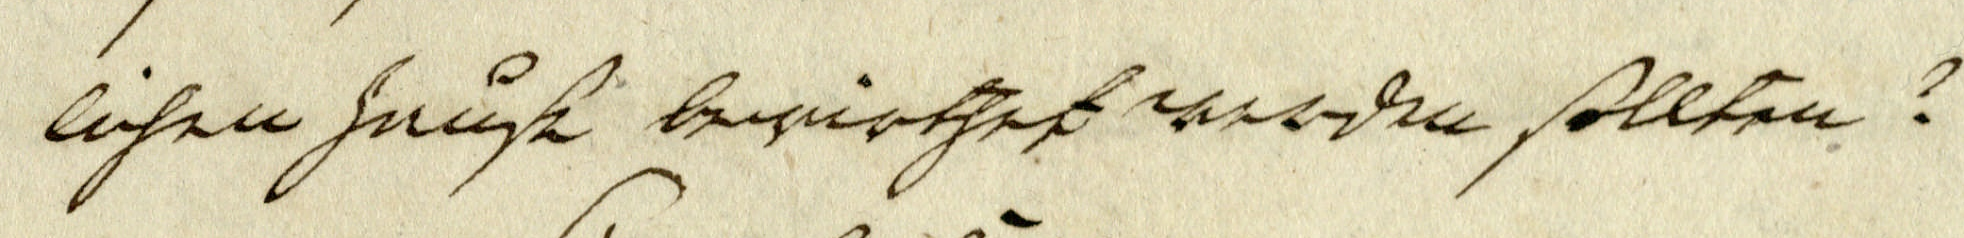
lichen Hause bewirthet werden sollten?
